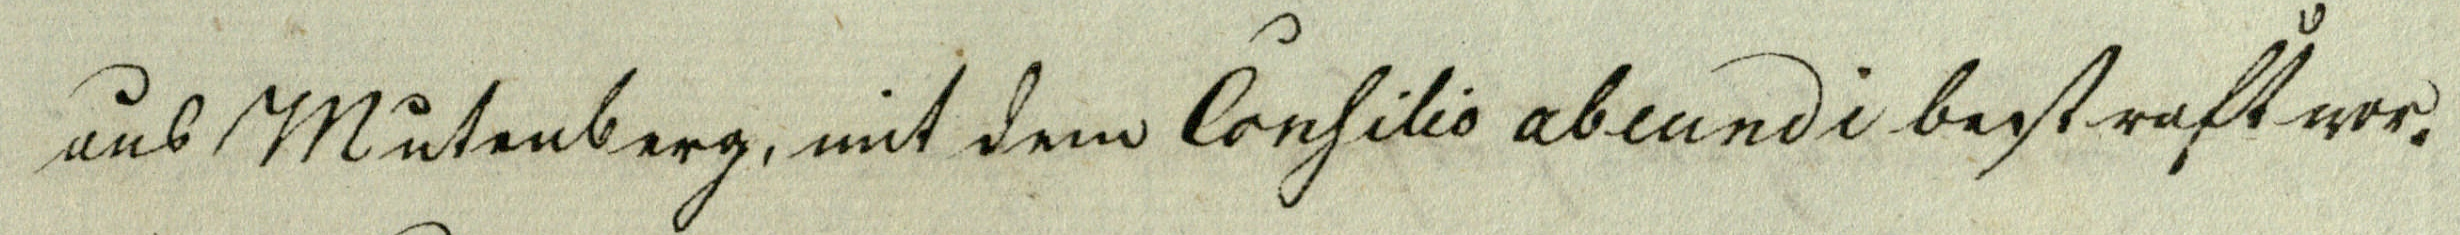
aus Mutenberg, mit dem Consilio abeundi bestraft wor¬
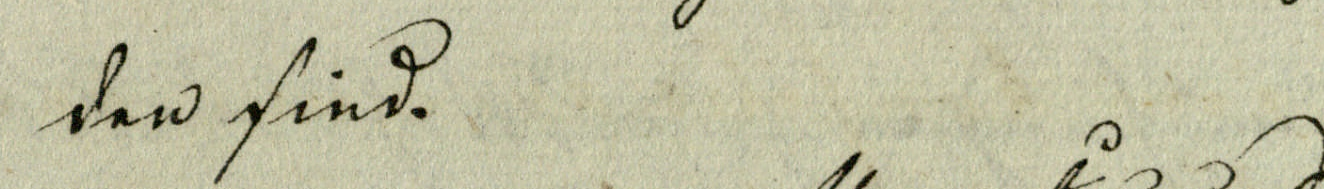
den sind.
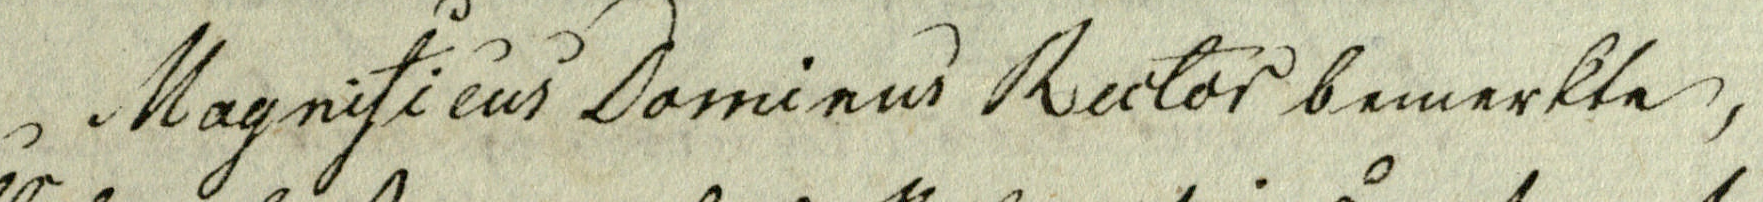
Magnificus Dominus Rector bemerkte,
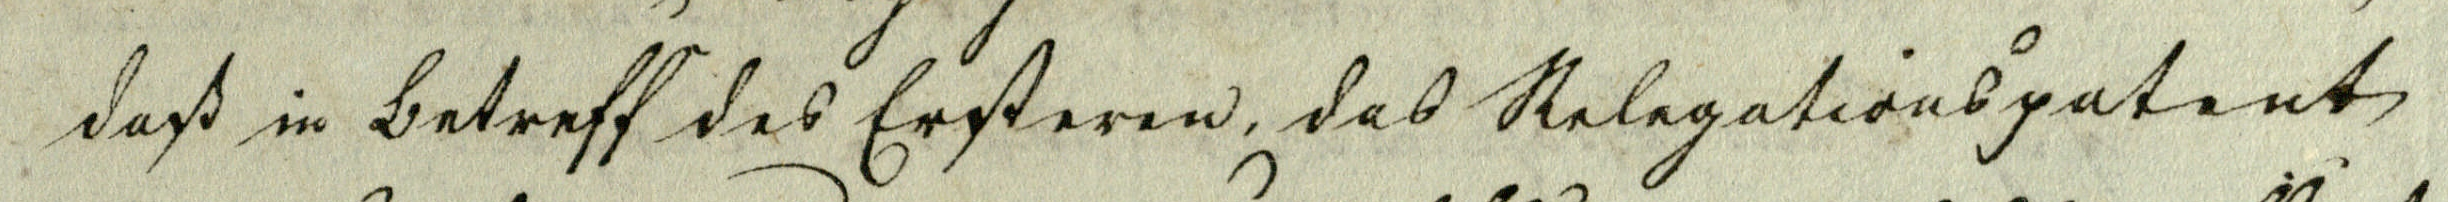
daß in Betreff des Ersteren, das Relegationspatent
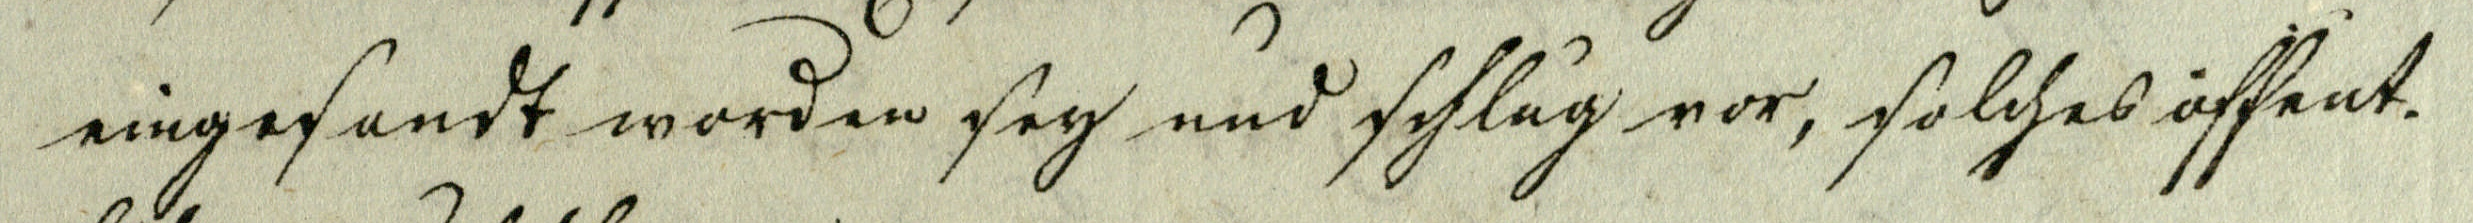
eingesandt worden sey und schlug vor, solches öffent¬
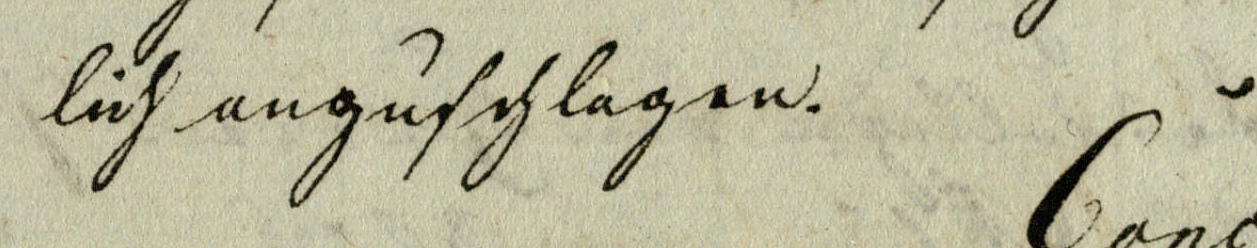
lich anzuschlagen.
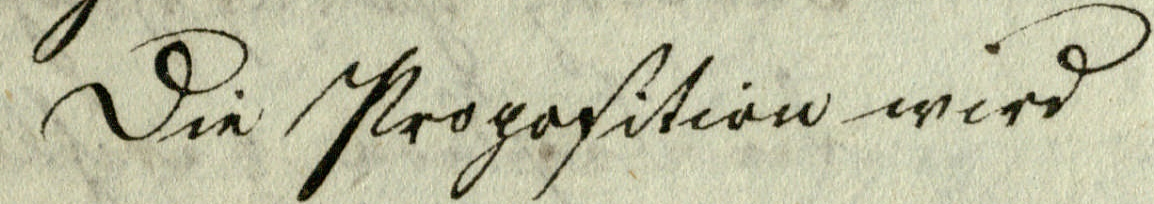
Die Proposition wird
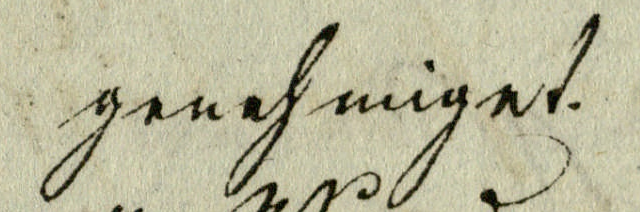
genehmiget.
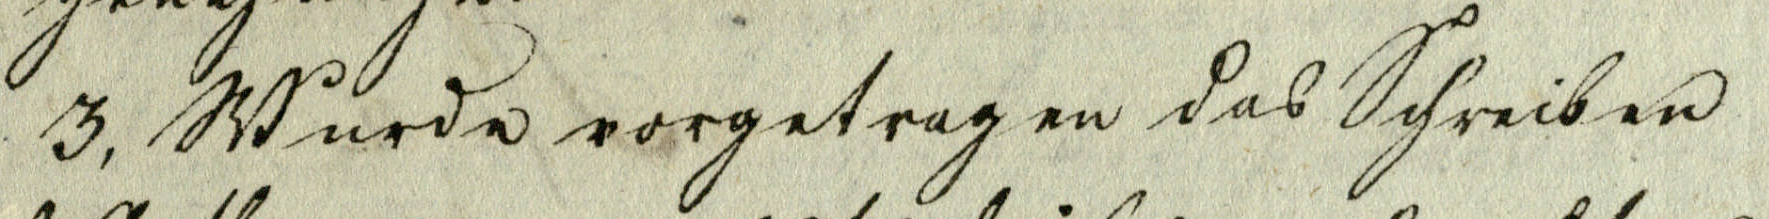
3, Wurde vorgetragen das Schreiben
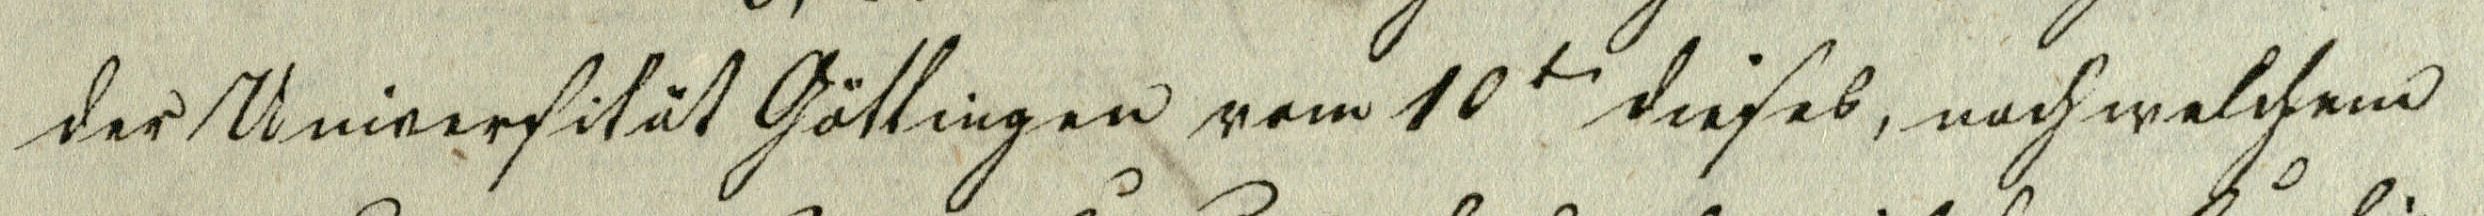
der Universität Göttingen vom 10ten dieses, nach welchem
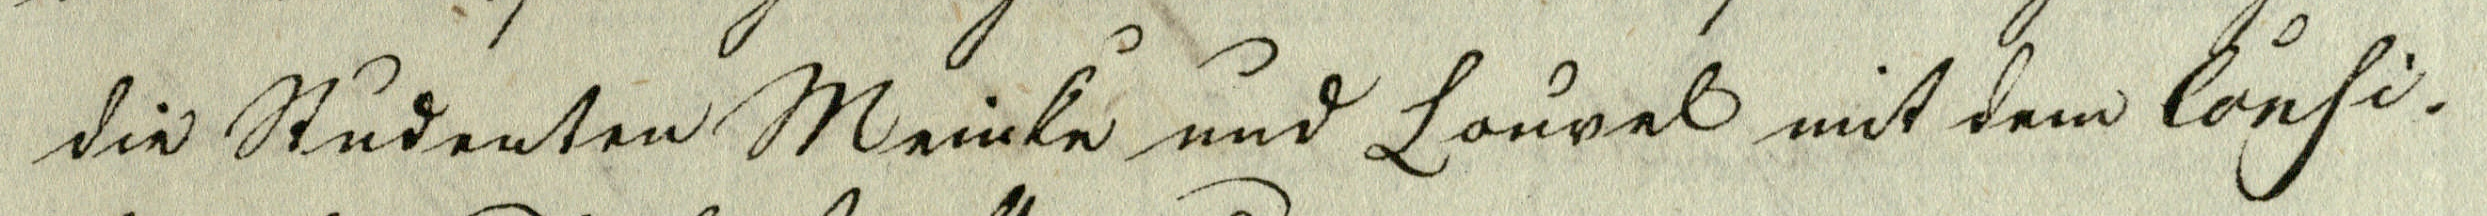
die Studenten Meinke und Louvel mit dem Consi¬
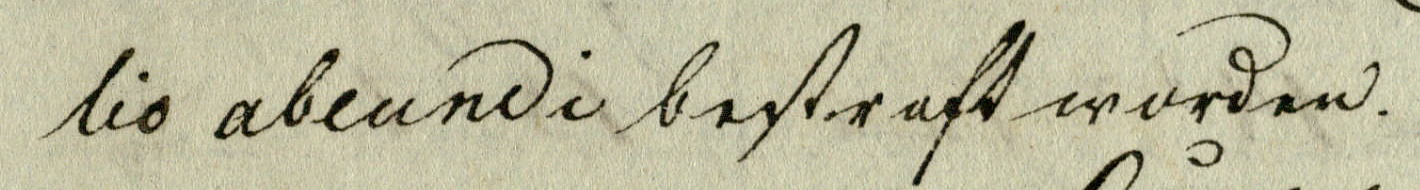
lio abeundi bestraft worden.
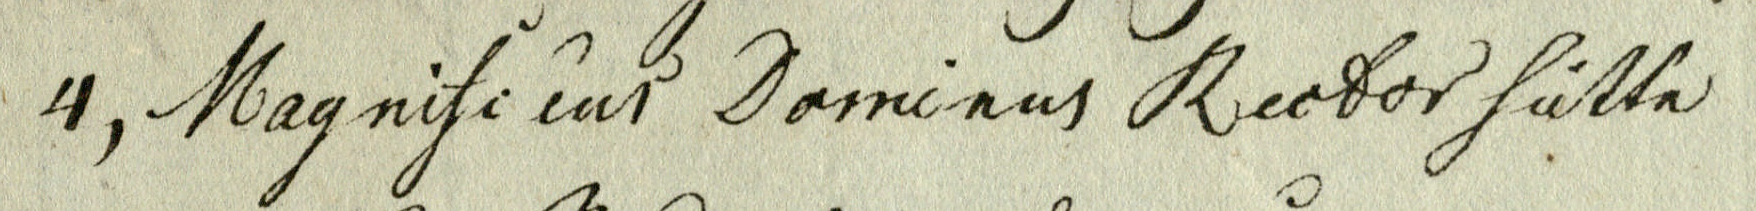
4, Magnificus Dominus Rector hätte
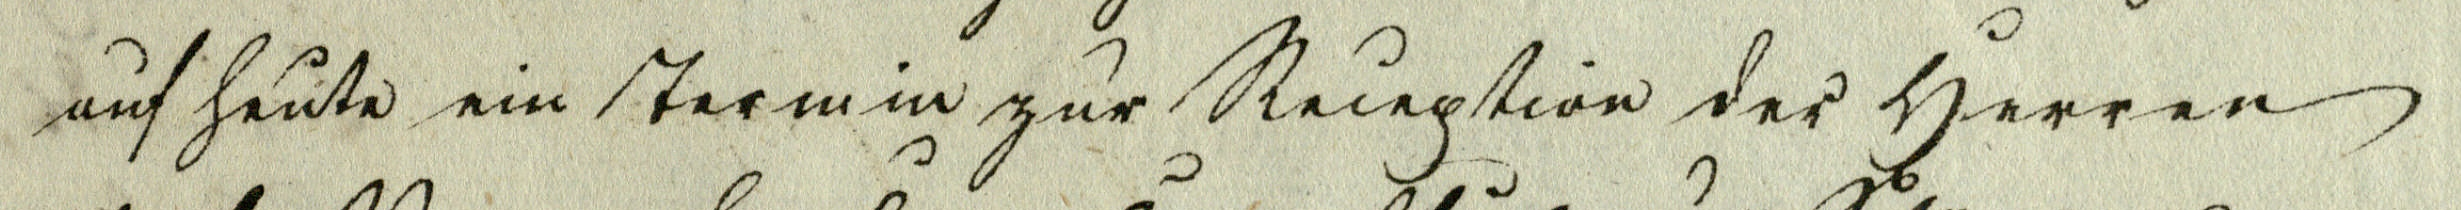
auf heute ein Termin zur Reception der Herren
